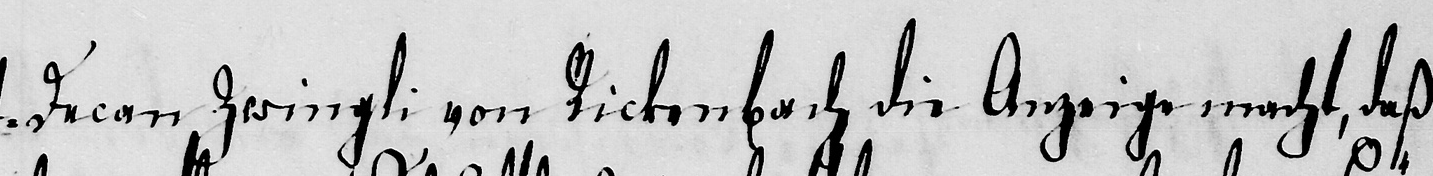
Decan Zwingli von Rickenbach die Anzeige macht, daß
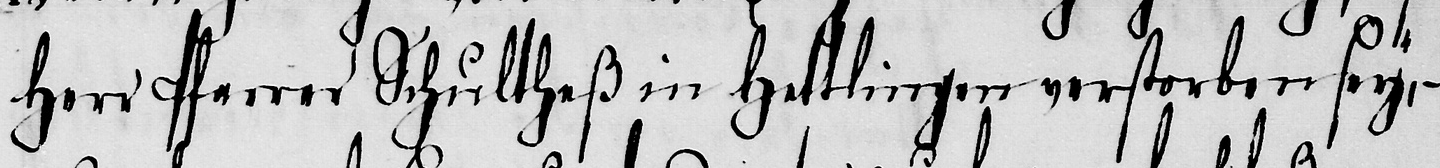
Herr Pfarrer Schultheß in Hettlingen verstorben sey, –
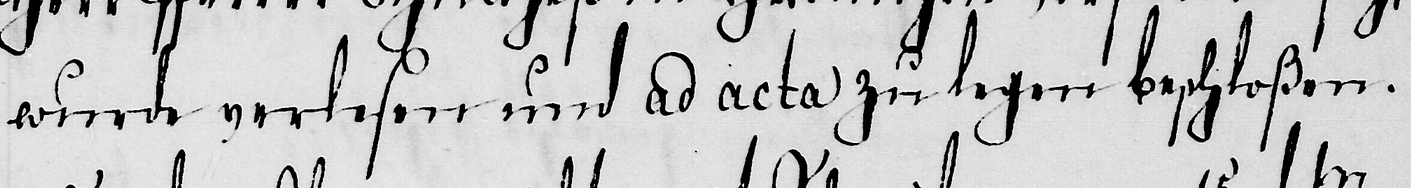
wurde verlesen und ad acta zu legen beschloßen.
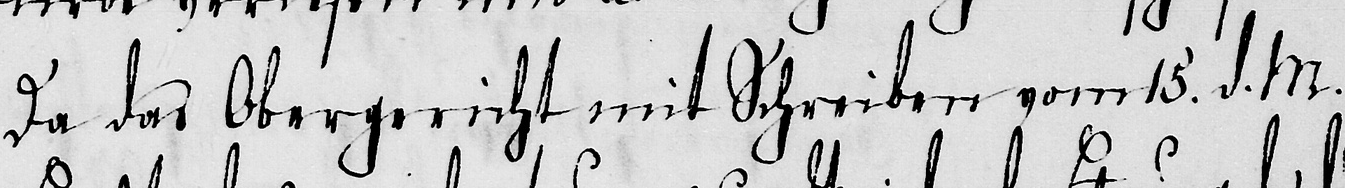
Da das Obergericht mit Schreiben vom 15. d. M.
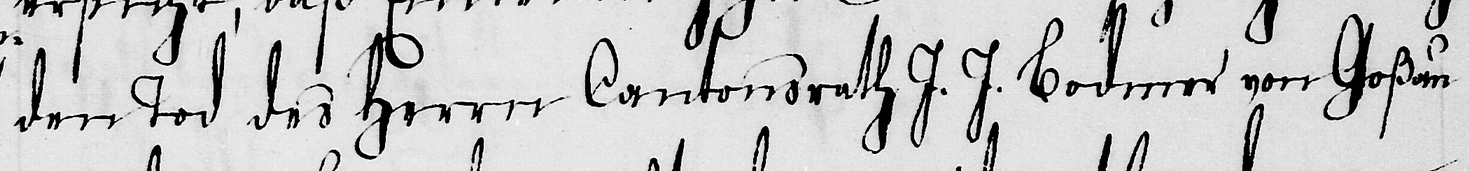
den Tod des Herrn Cantonsrath J. J. Bodmer von Goßau
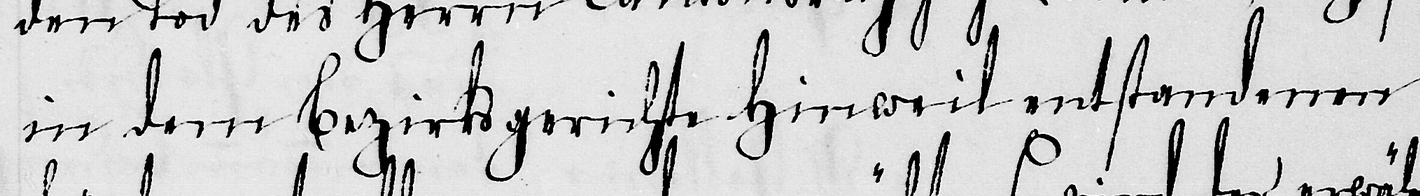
in dem Bezirksgerichte Hinweil entstandenen
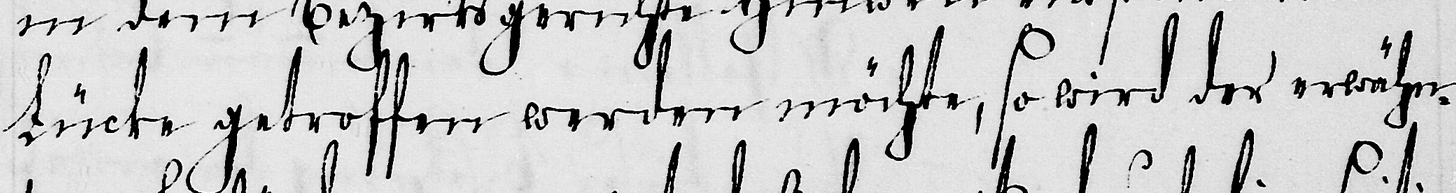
Lücke getroffen werden möchte, so wird der erwähn¬
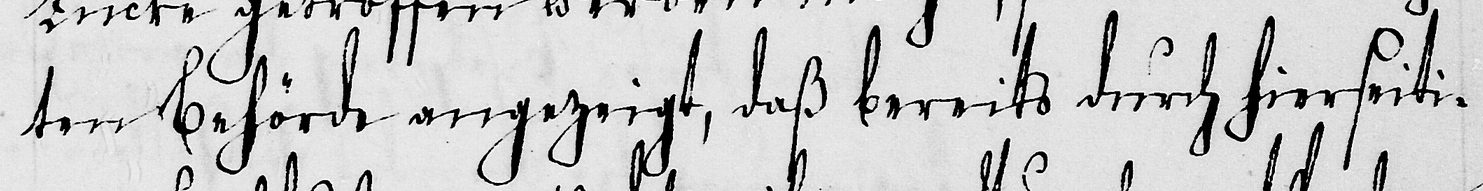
ten Behörde angezeigt, daß bereits durch hierseiti¬
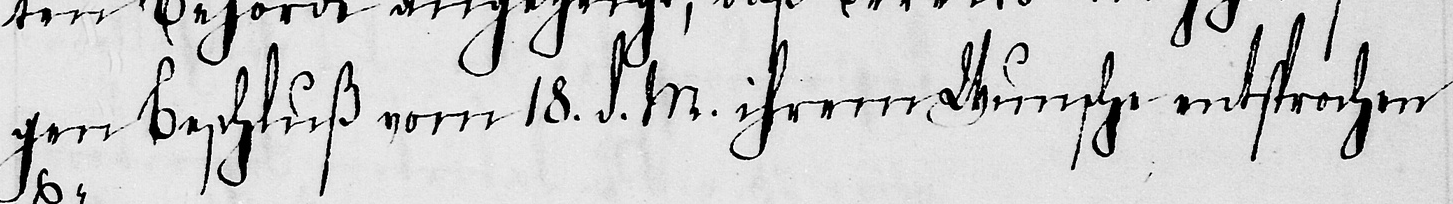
gen Beschluß vom 18. d. M. ihrem Wunsche entsprochen
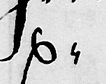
li¬
